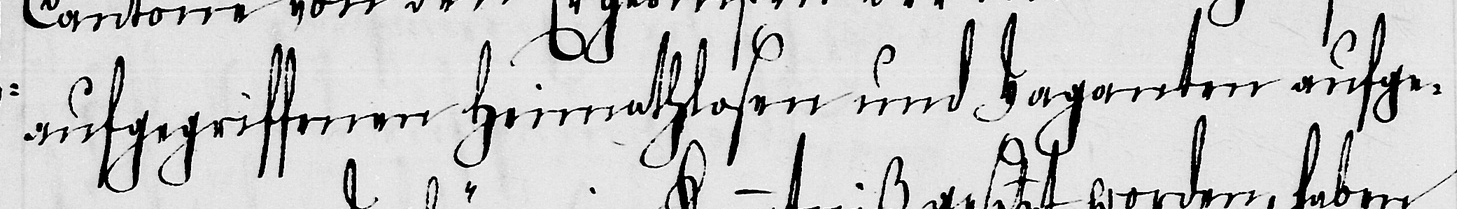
aufgegriffenen Heimathlosen und Vaganten aufge¬
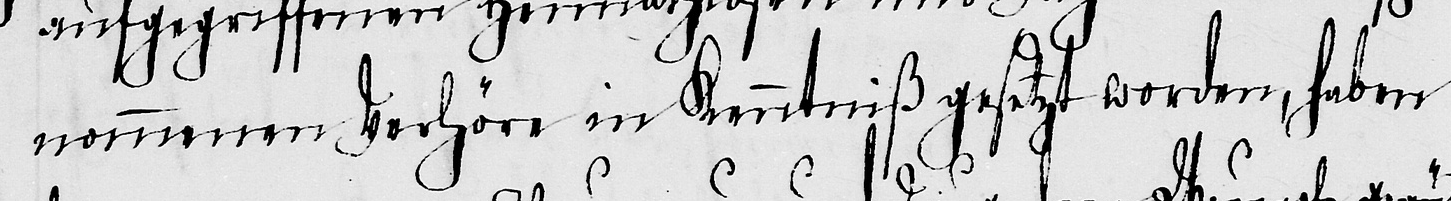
nommenen Verhöre in Kenntniß gesetzt worden, haben
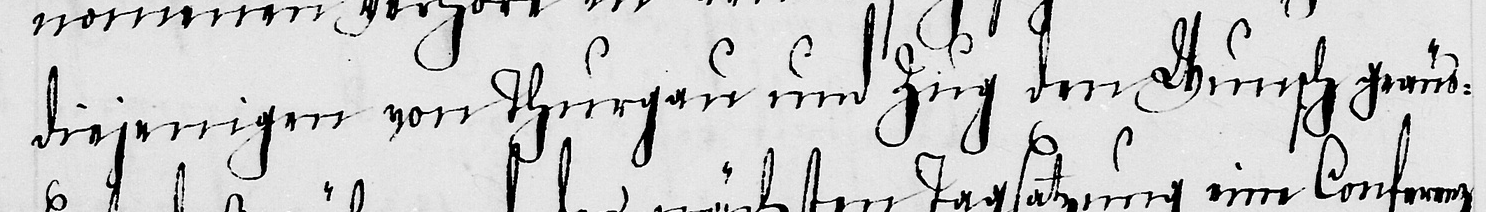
diejenigen von Thurgau und Zug den Wunsch geäuß¬
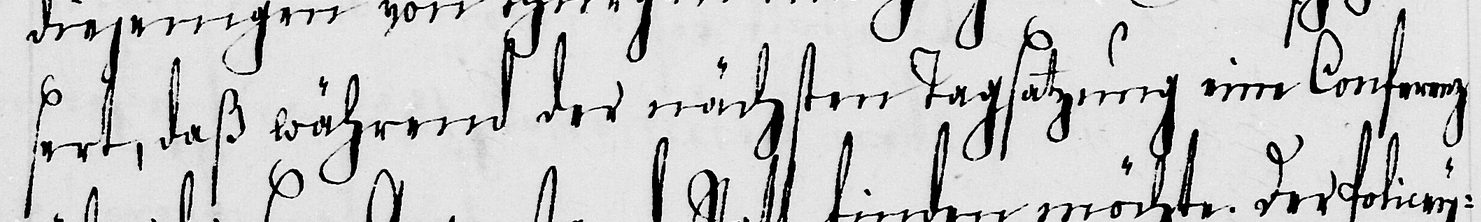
ert, daß während der nächsten Tagsatzung eine Conferenz
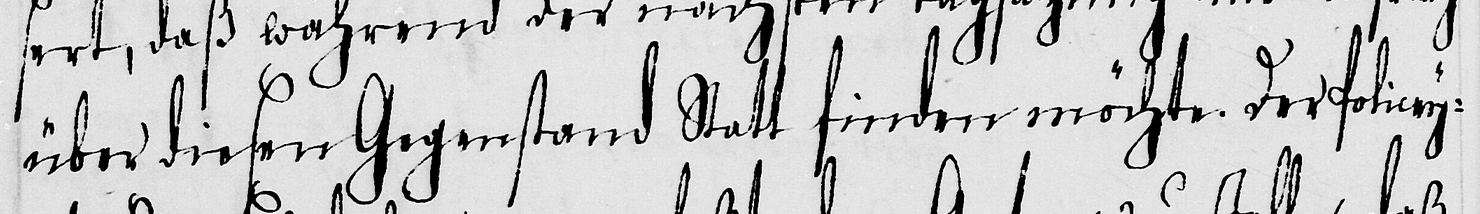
über diesen Gegenstand Statt finden möchte. Der Poli¬
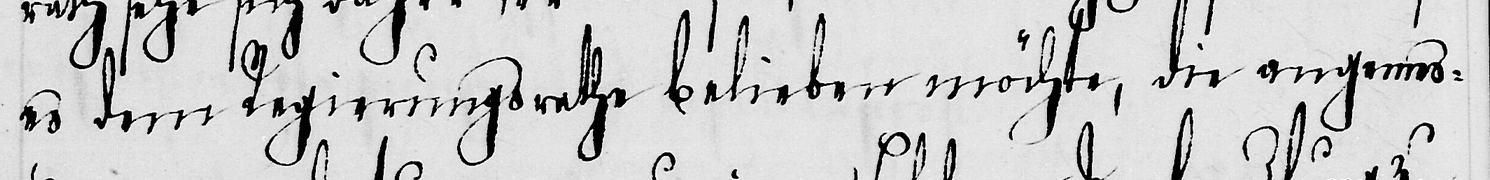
es dem Regierungsrathe belieben möchte, die angemeß¬
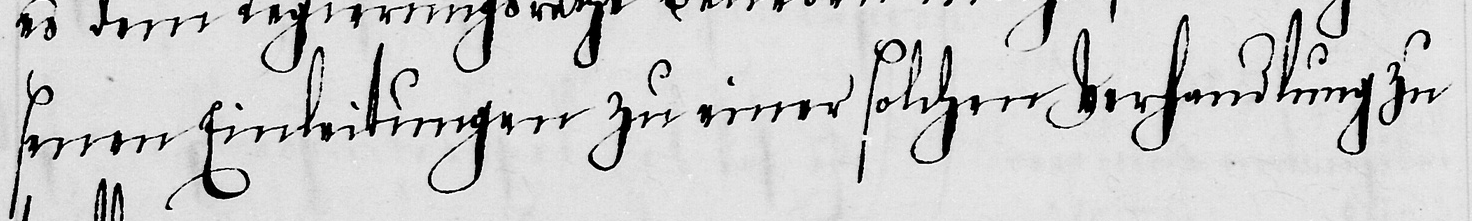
enen Einleitungen zu einer solchen Verhandlung zu
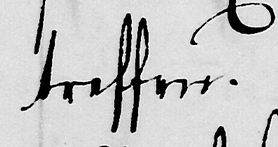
treffen.
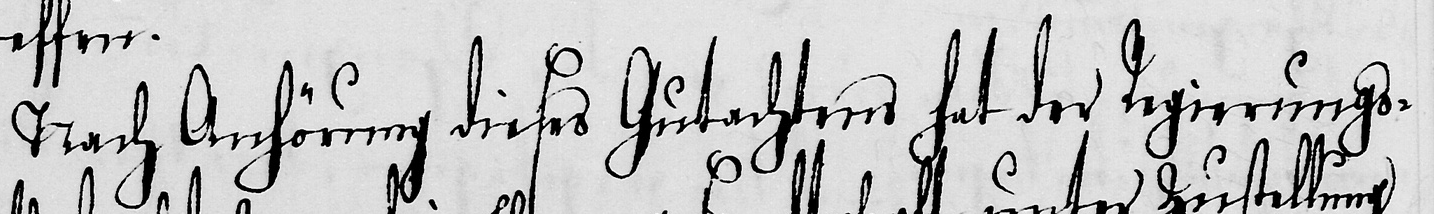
Nach Anhörung dieses Gutachtens hat der Regierungs¬
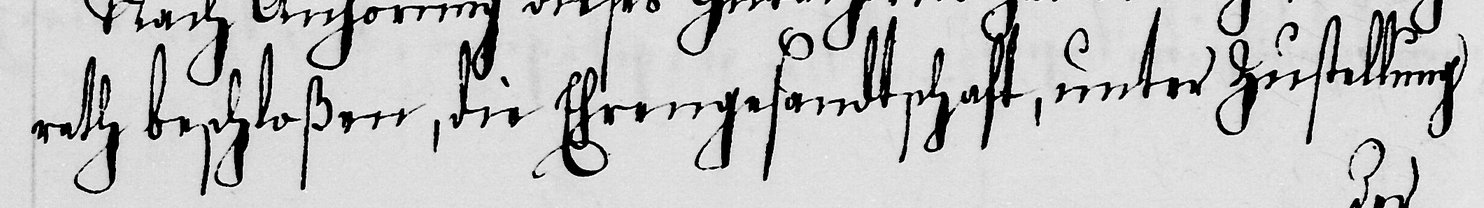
rath beschloßen, die Ehrengesandtschaft, unter Zustellung
